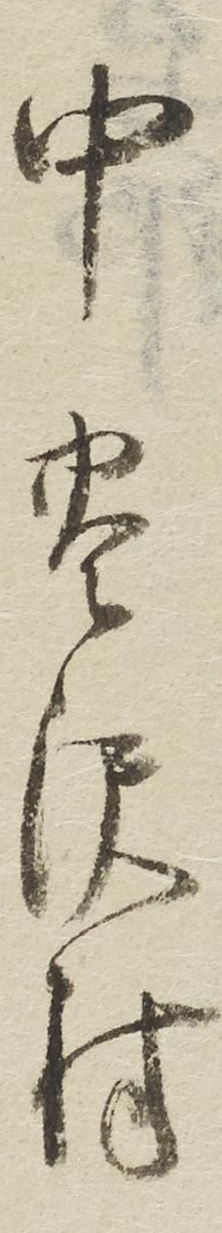中豊沢村

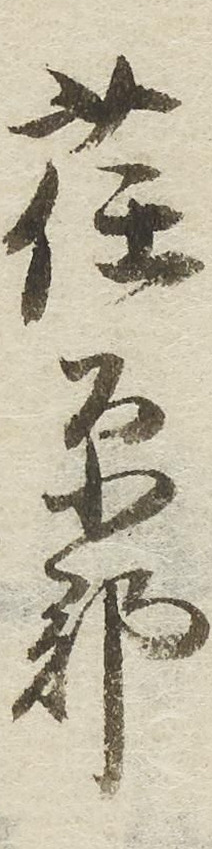荏原郡
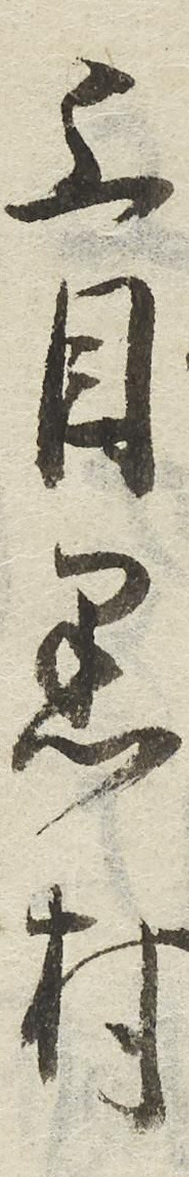上目黒村
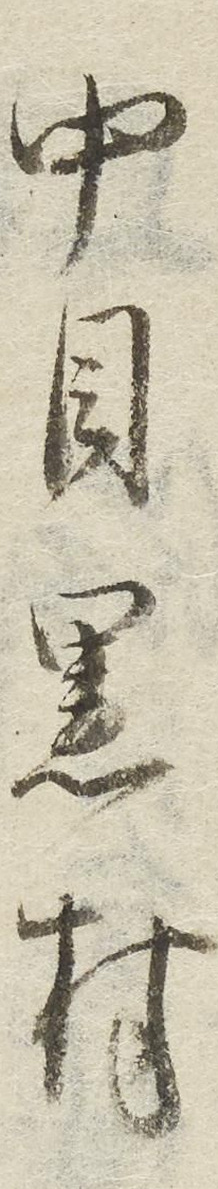中目黒村
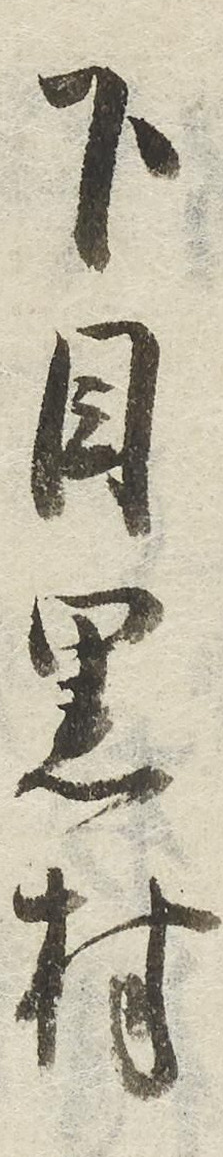下目黒村
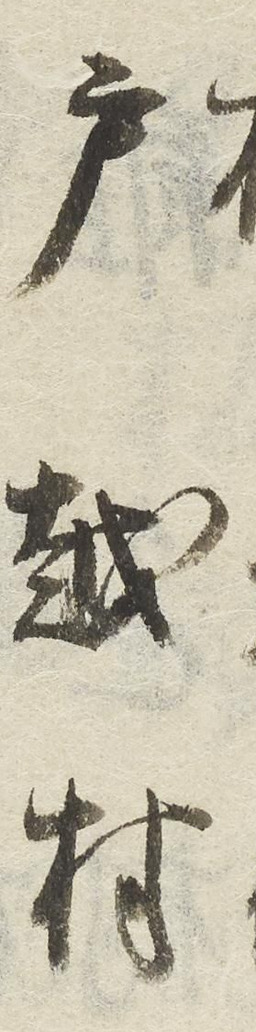戸越村
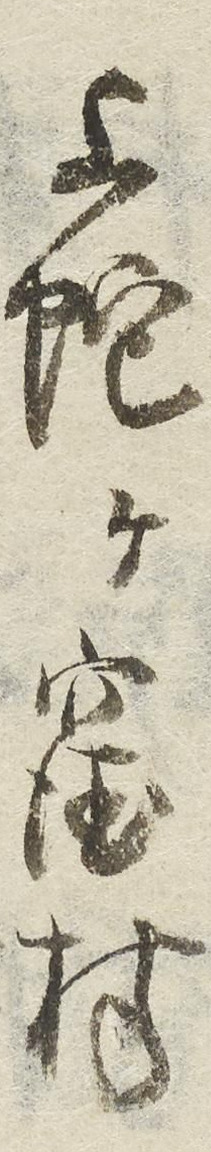上蛇ヶ窪村
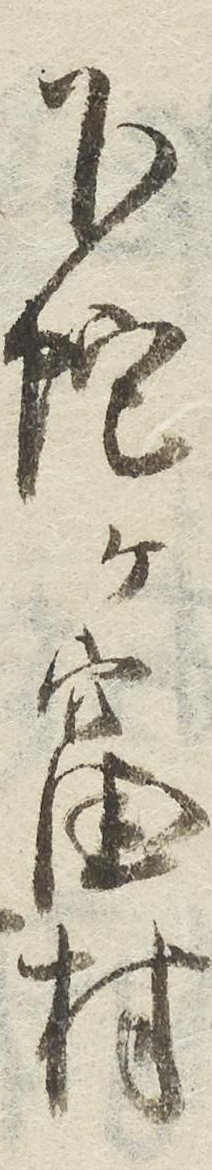下蛇ヶ窪村
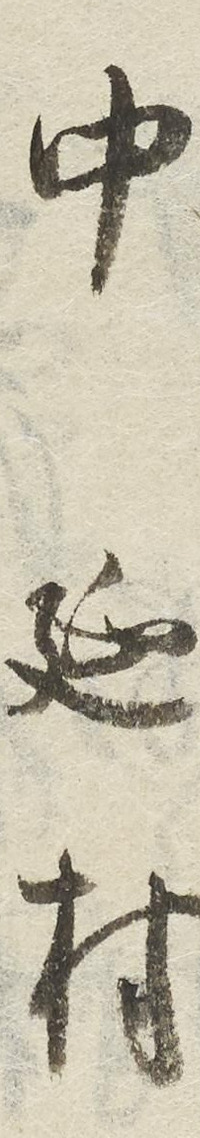中延村
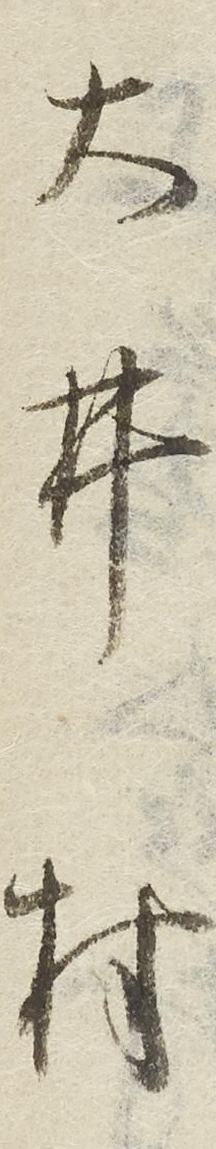大井村
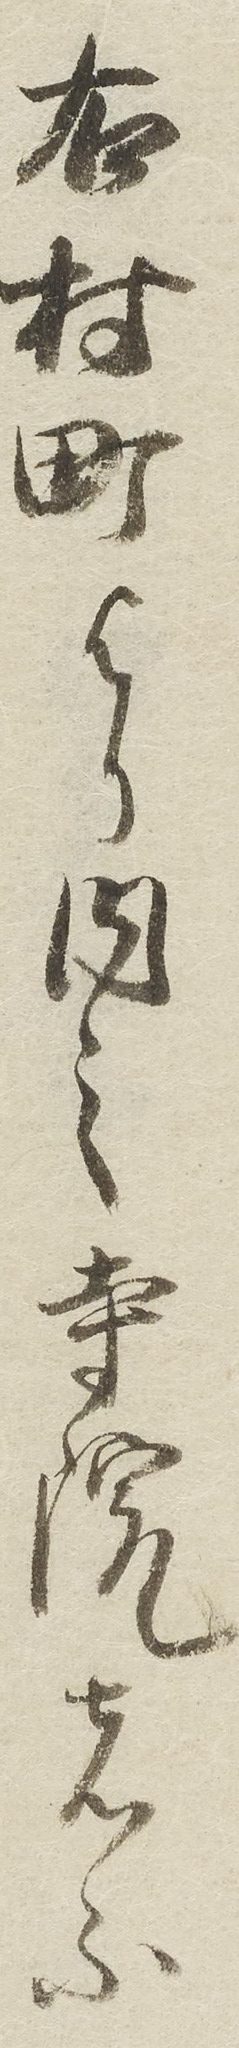右村町より内々之寺院は不
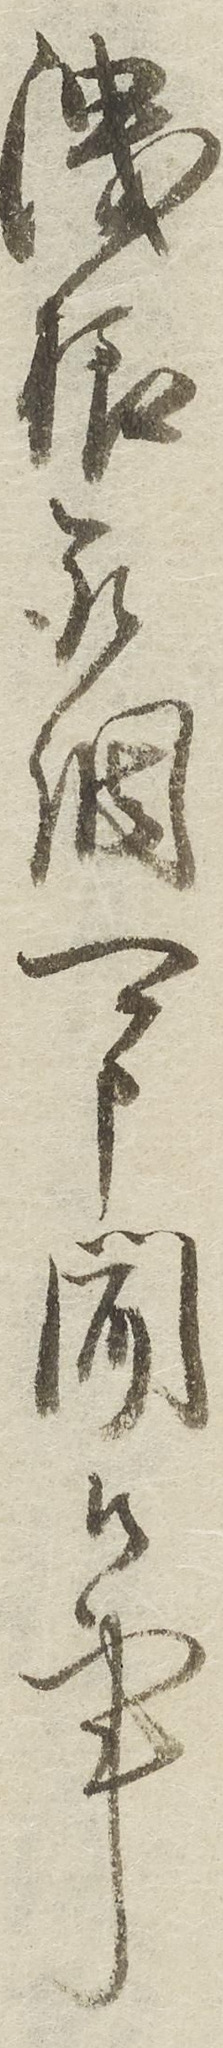洩様取調可申聞候事

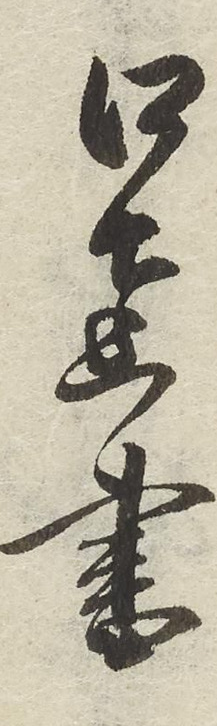口達書
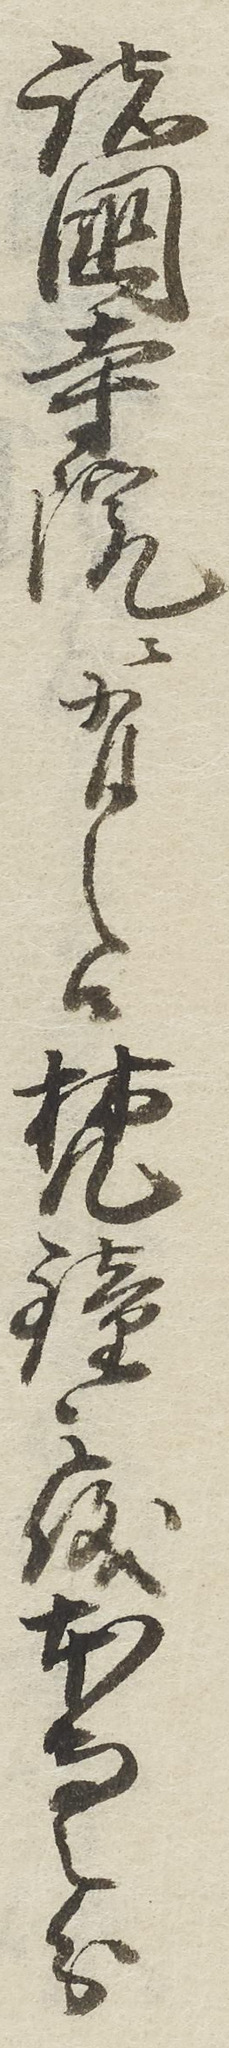諸国寺院二有之候梵鐘之儀本寺之分
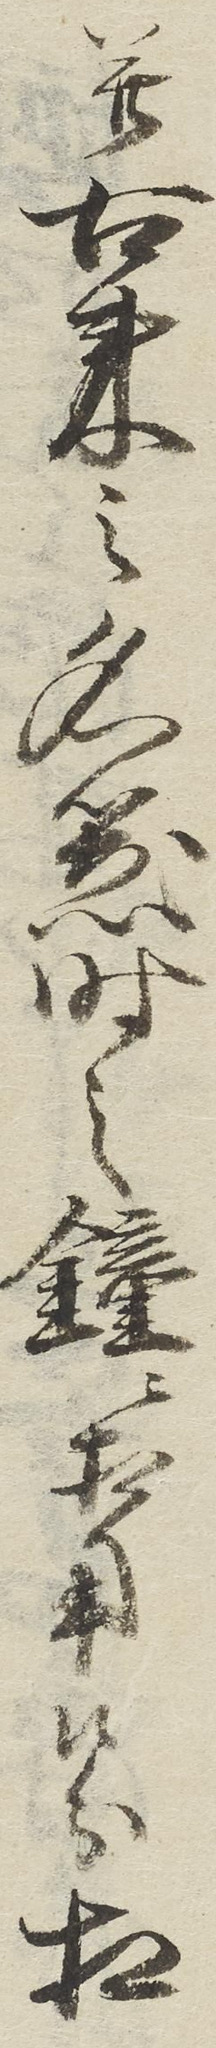并古来之名器時之鐘二相用候分相
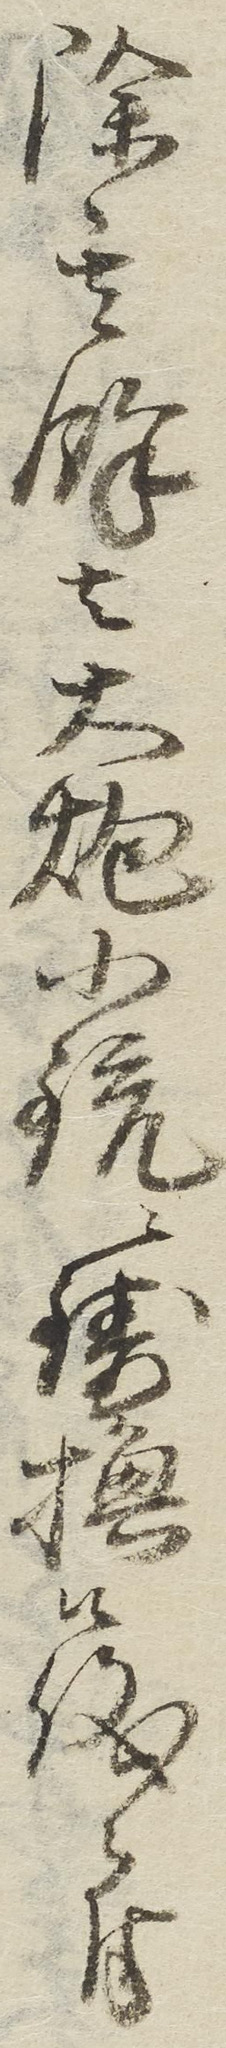除其餘は大炮小銃二鋳換候儀二付
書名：[梵鐘差出一件]
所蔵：東京大学地震研究所図書室 Earthquake Research Institute Library, The University of Tokyo, JAPAN
